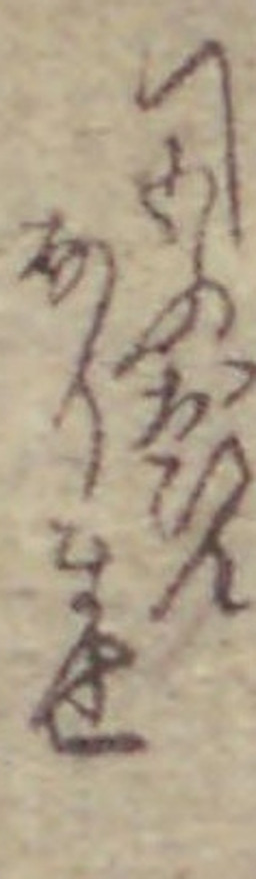なりませ
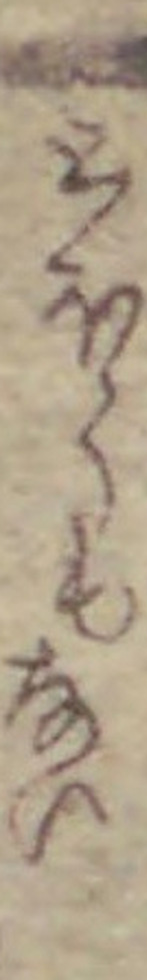とほうもない
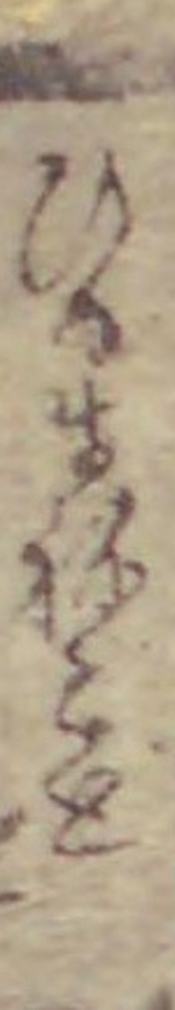ひるまねことを
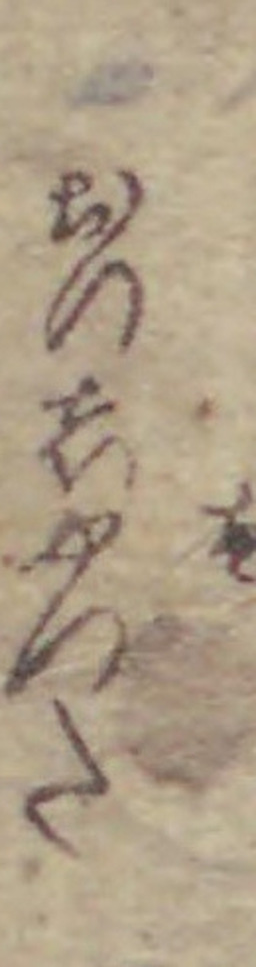おつしやつた

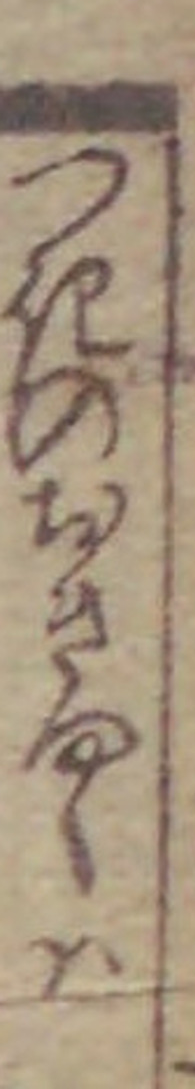つきのおきやくは
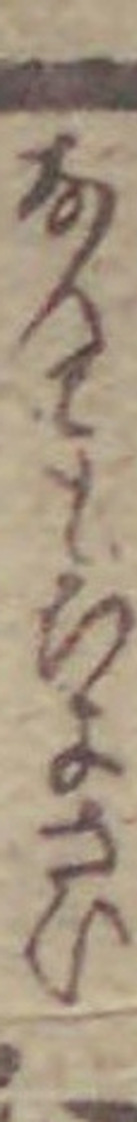なんてもちよさい
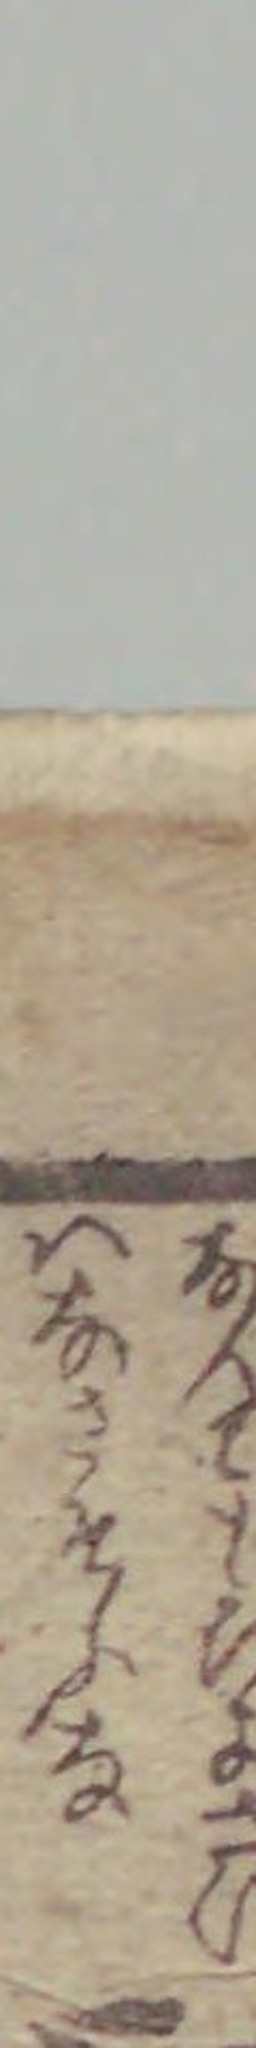はなさそふな
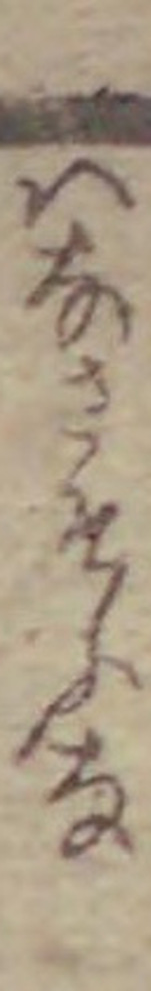はなさそふな
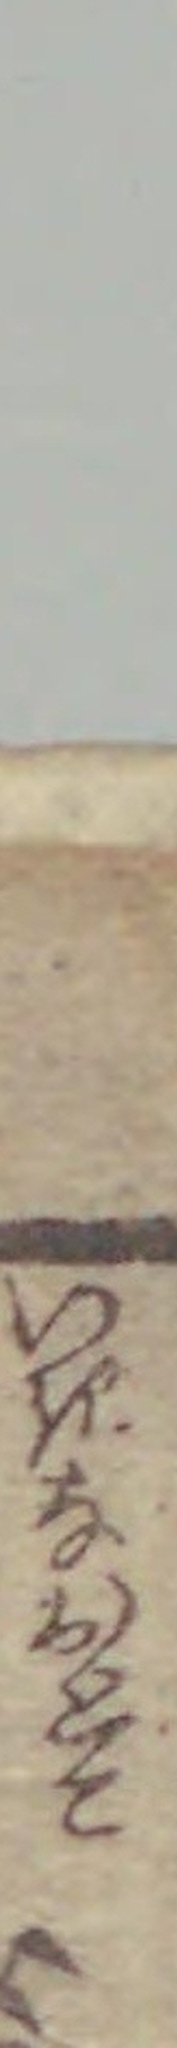いきなおとこ
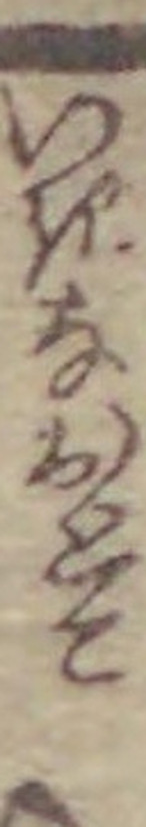いきなおとこ
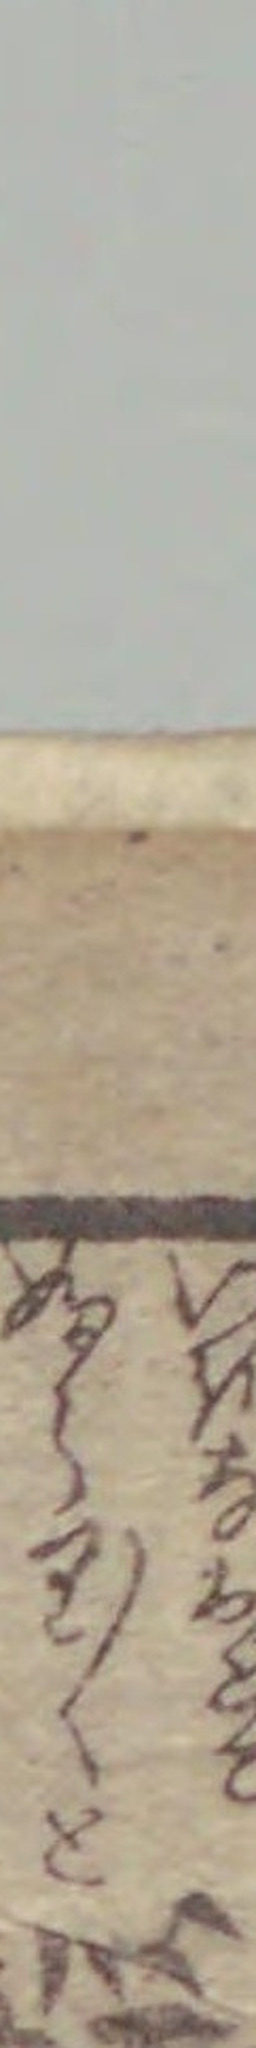ふらり〳〵と
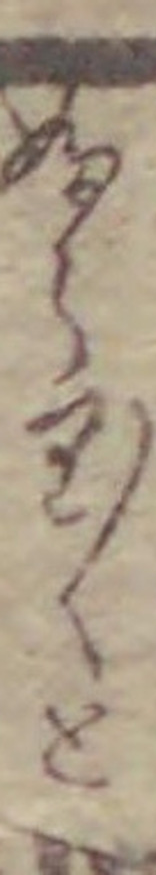ふらり〳〵と
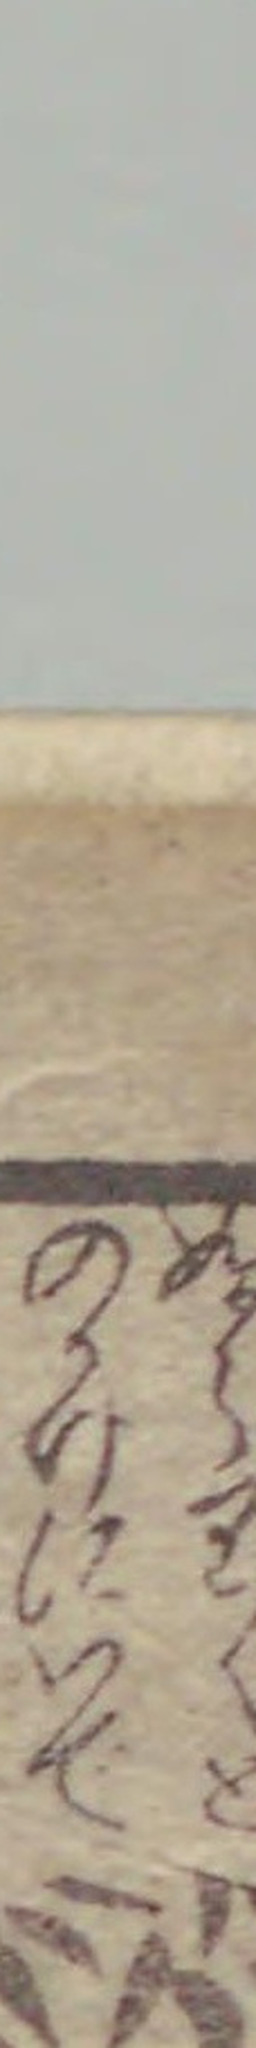のかけにいて
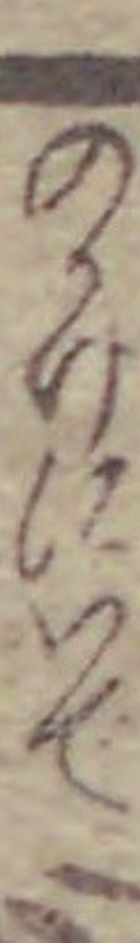のかけにいて
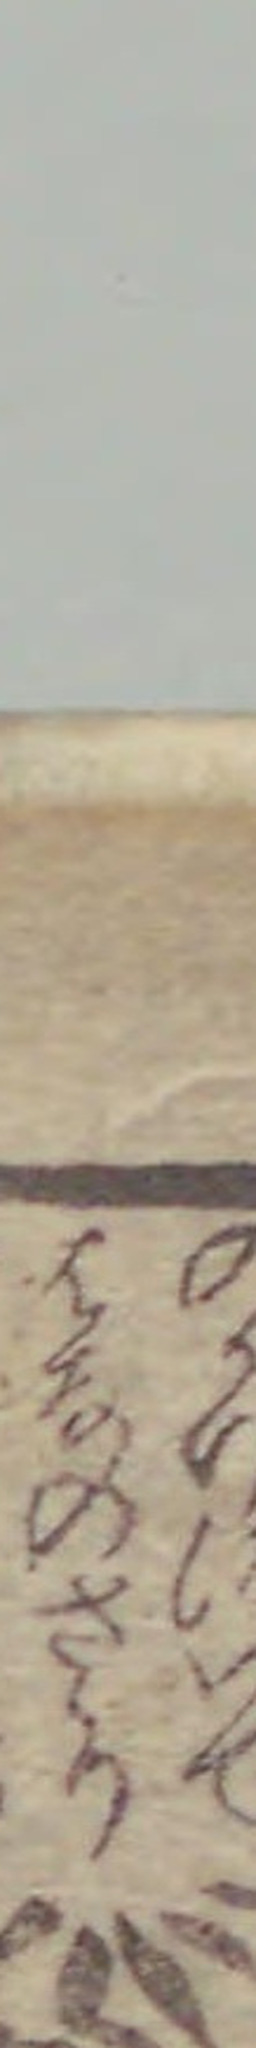はなのさう
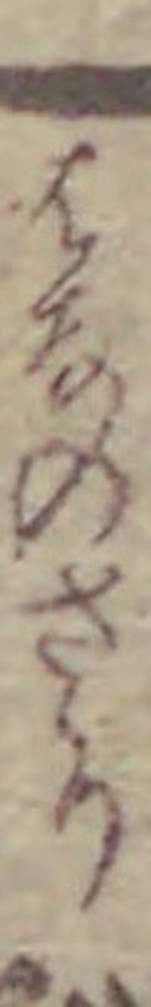はなのさう
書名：思事夢濃枕 3巻
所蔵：国立国会図書館 National Diet Library, JAPAN
